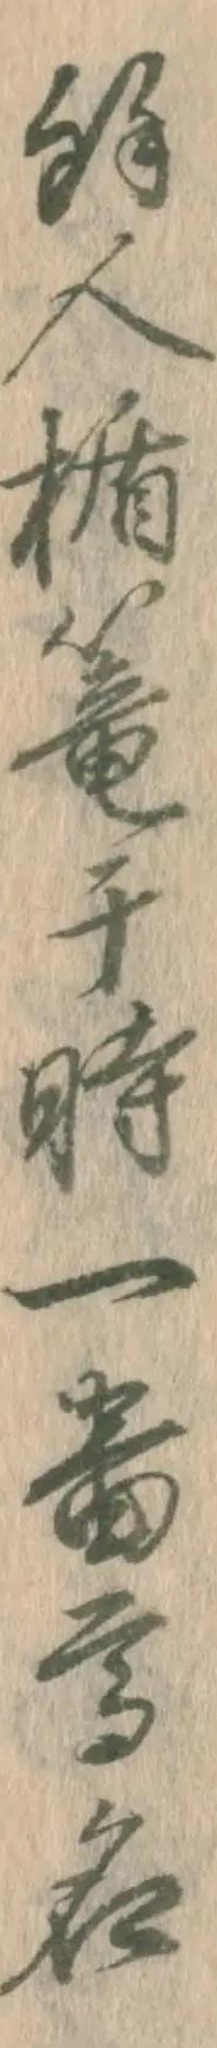余人楯篭干時一番高名
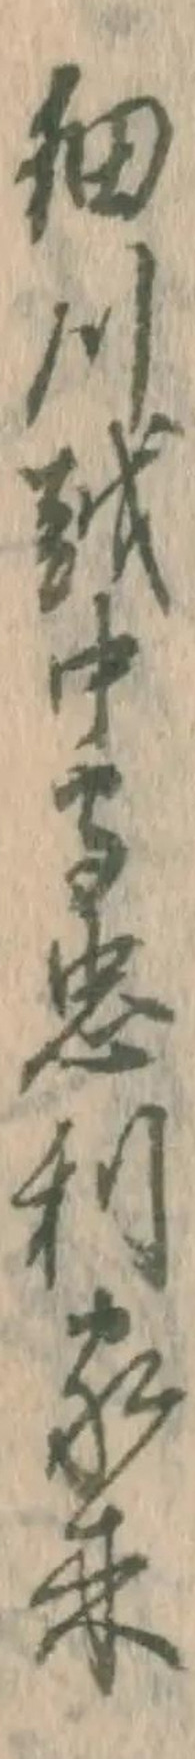細川越中守忠利家来
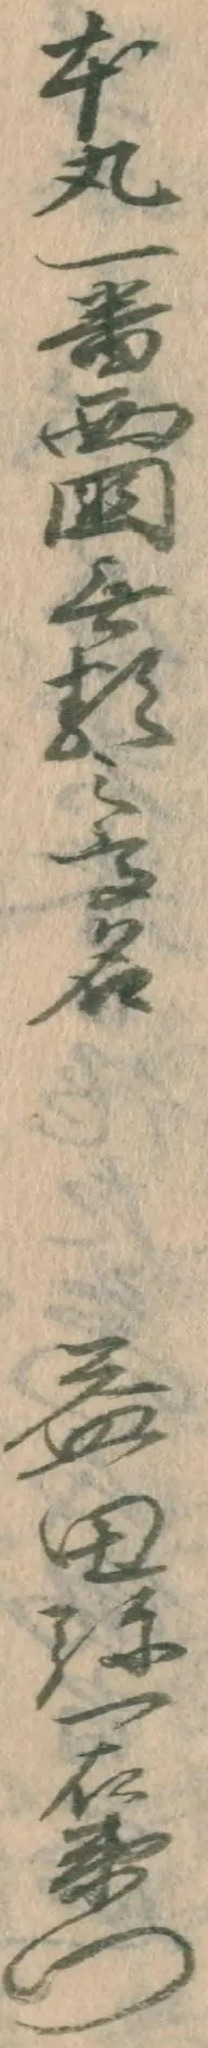本丸一番西国無類之高名益田弥一右衛門
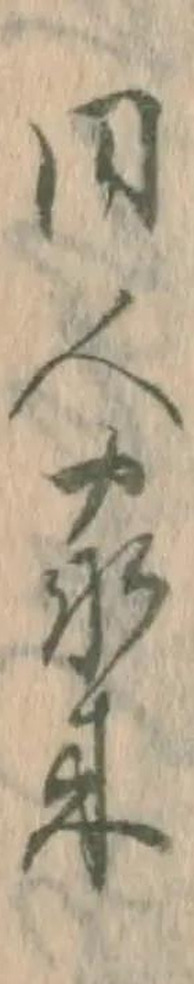同人家来
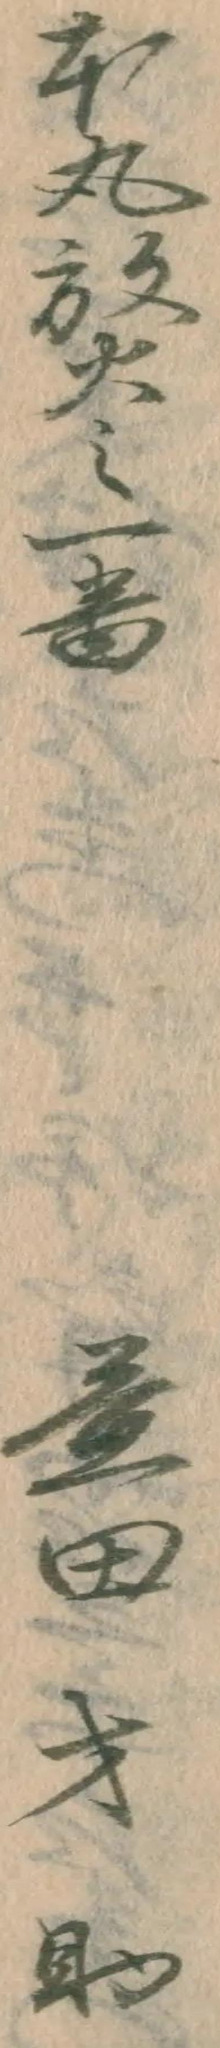本丸放火之一番益田才助
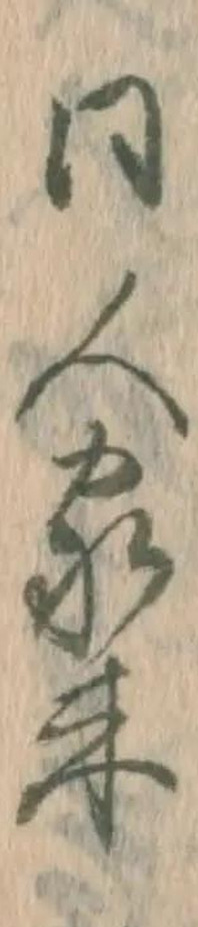同人家来
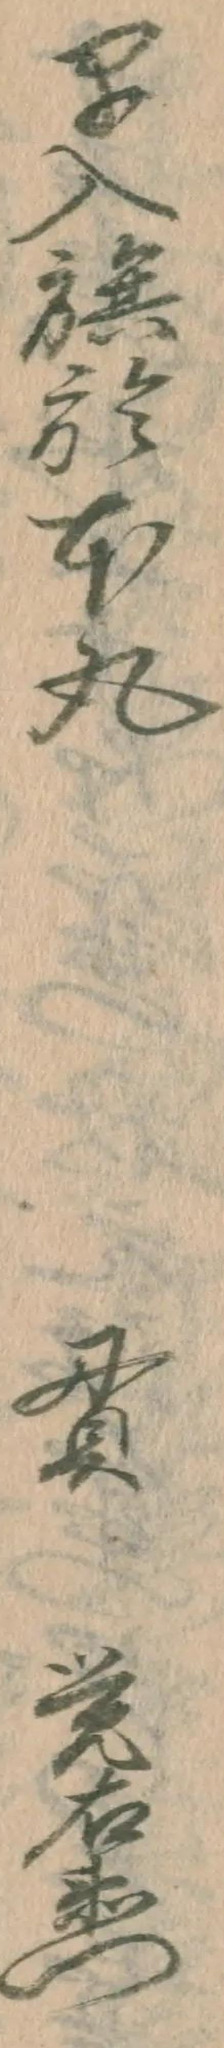早入旗於本丸貫覚右衛門
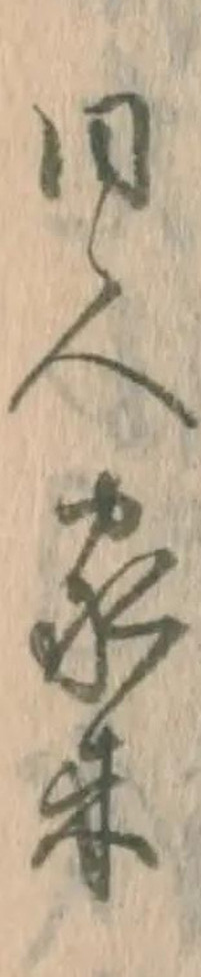同人家来
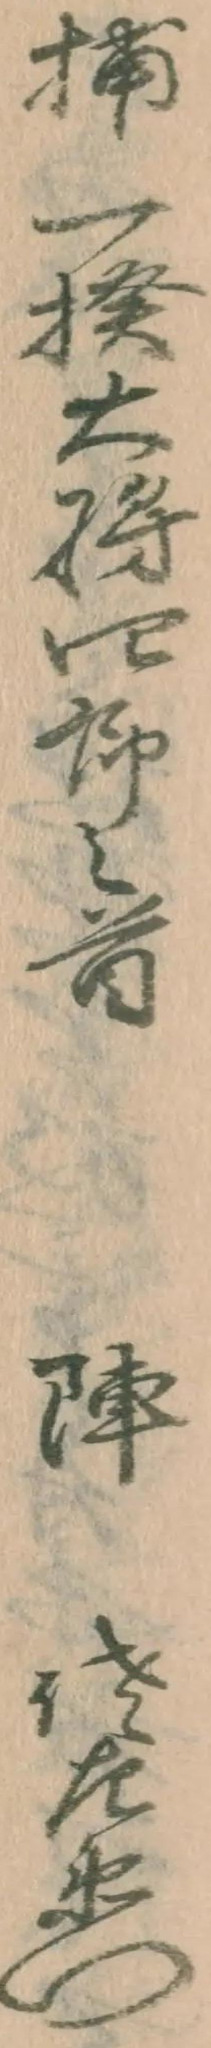捕一揆大将四郎之首陣佐左衛門
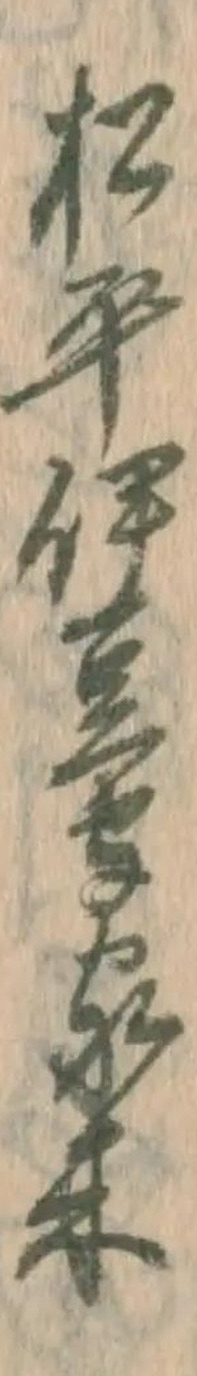松平伊豆守家来
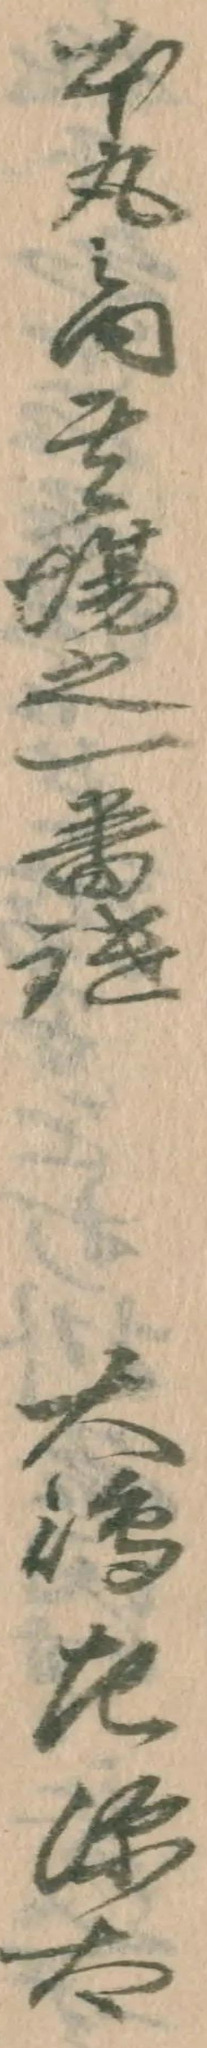本丸之内其場之一番鑓大島左源太
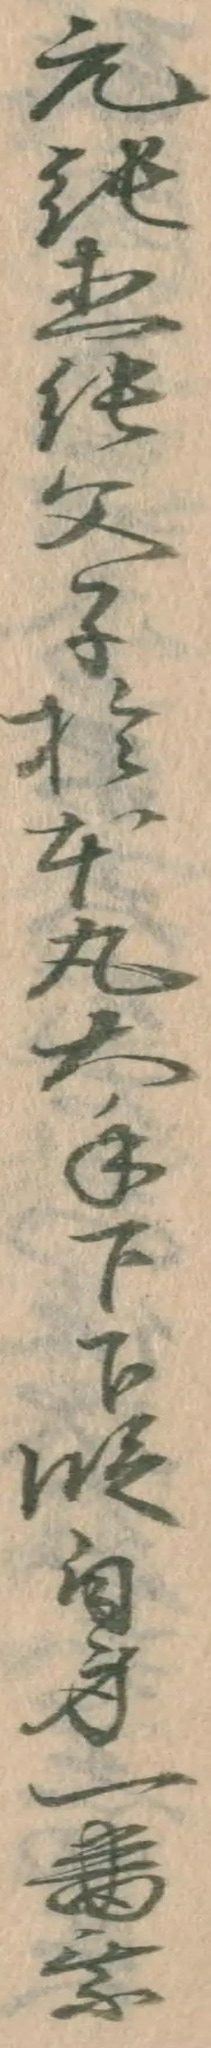元純直純父子於本丸大手下下段自身一番乗
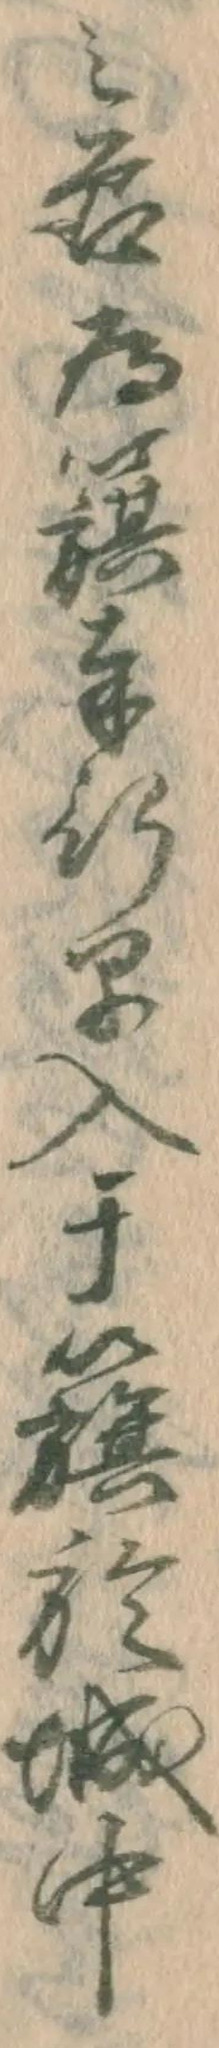之節為籏奉行早入干籏於城中
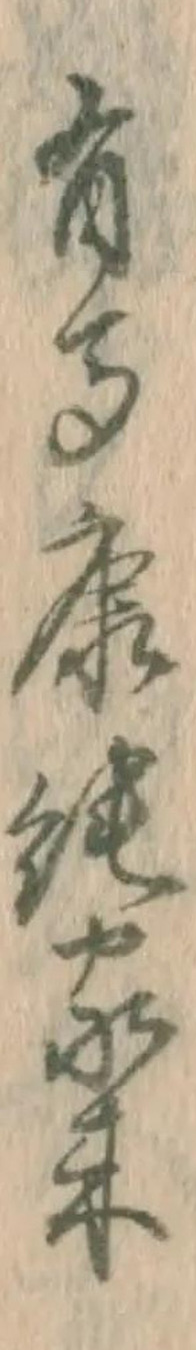有馬康純家来
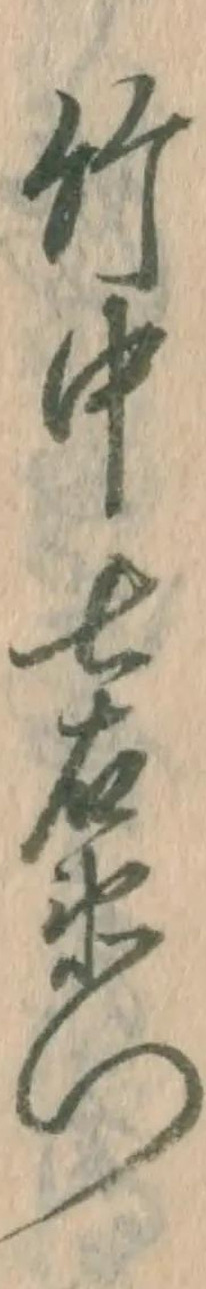竹中七右衛門
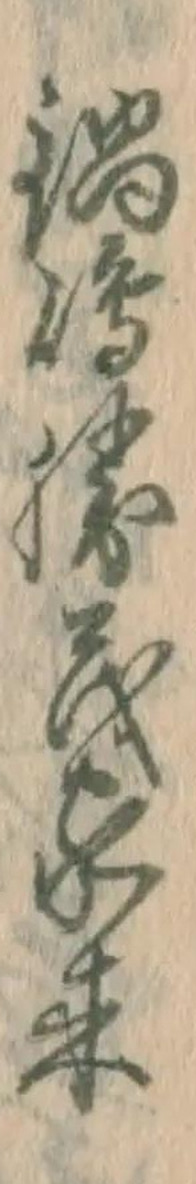鍋島勝茂家来
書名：切支丹御退治記 49巻. [8]
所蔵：国立国会図書館 National Diet Library, JAPAN
